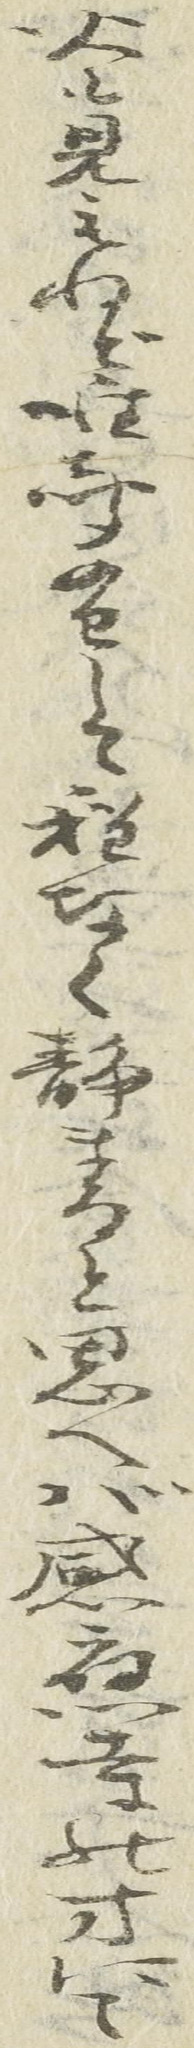火も見えねど唯声のせして程なく静まると思へば感応寺の此方にて
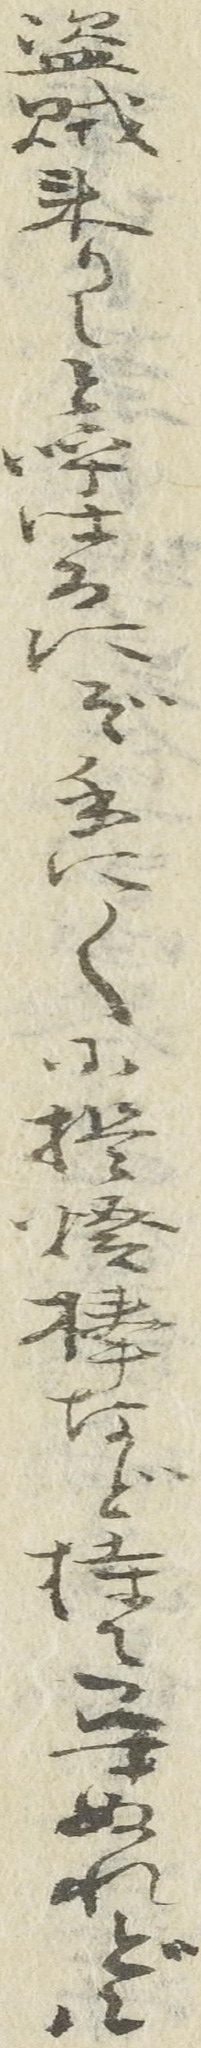盗賊来りしと呼はるにぞ手に〳〵に提燈棒など持て尋ぬれども
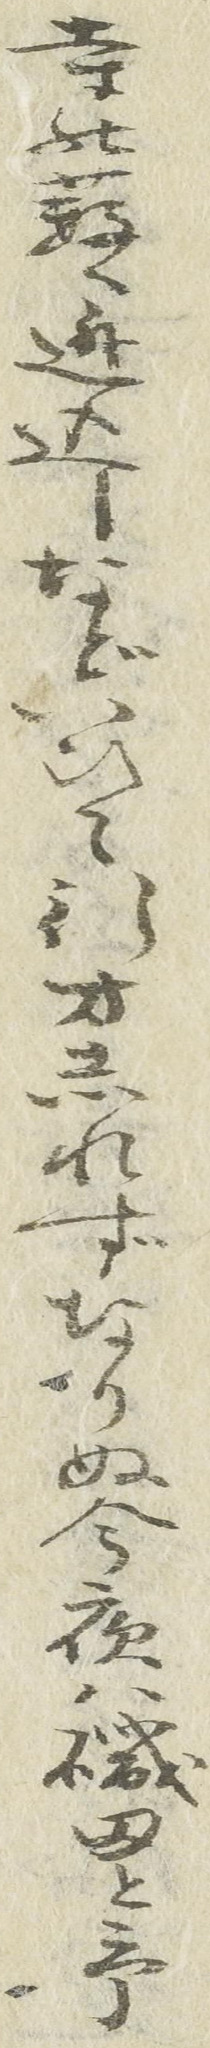寺の藪へ逃込しなどいひて行方しれずなりぬ今夜は磯田と予
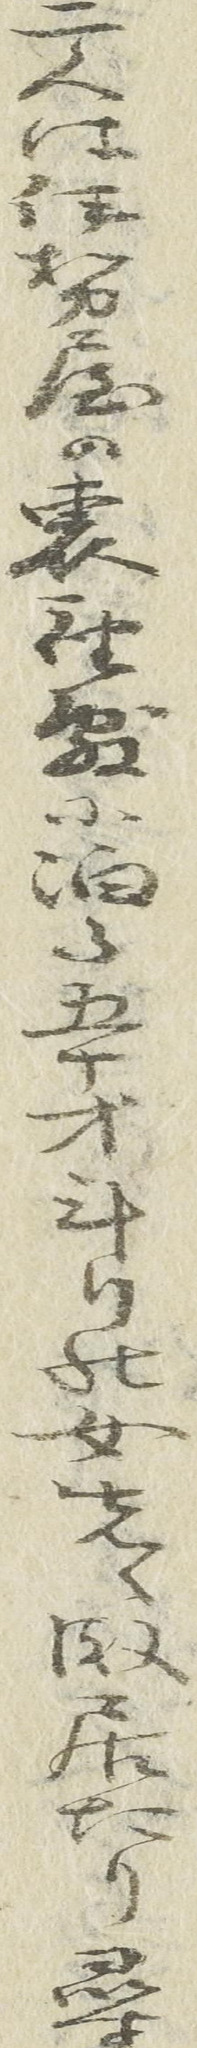二人は伊勢屋の裏座敷に泊る五十才斗りの女先へ臥居たり尋
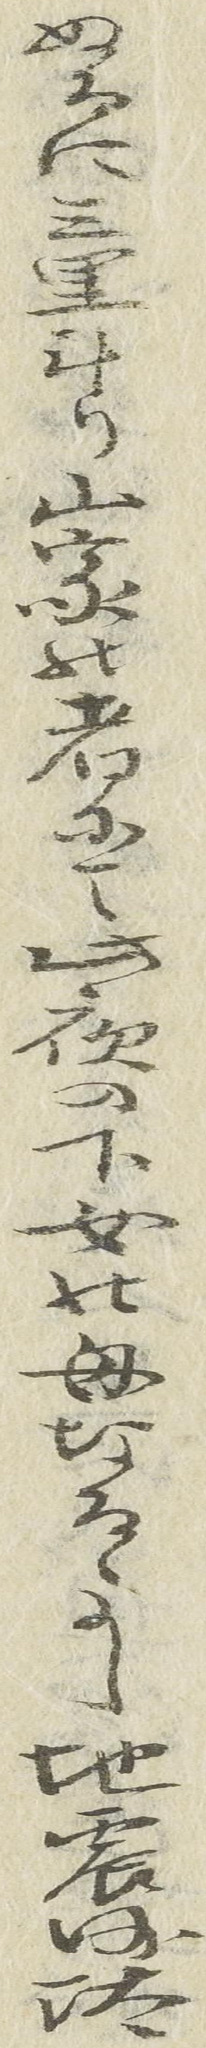ぬるに三里斗り山家の者にて此夜の下女の母なるよし地震沙汰
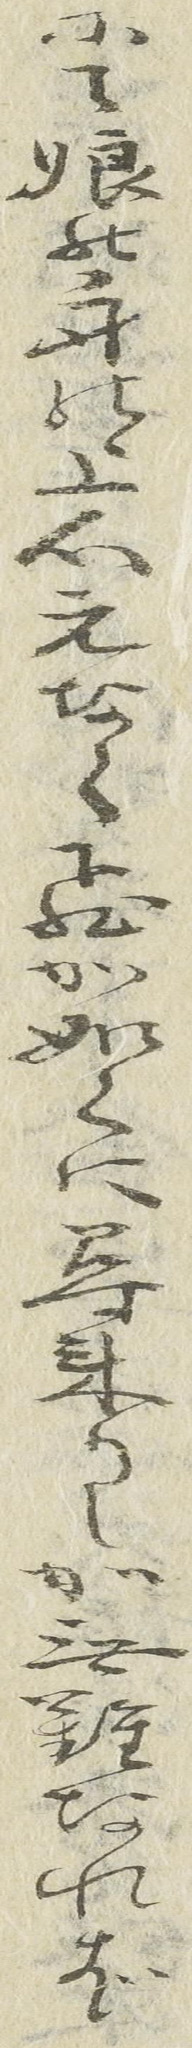にて娘の身の上心元なく飛か如くに尋来りしか無難なれば
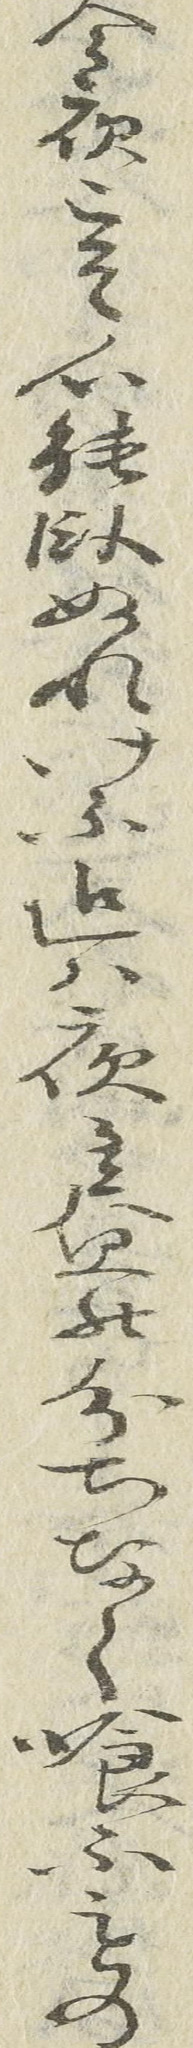今夜こそ心能臥ぬれけふ迄は夜か昼の分ちなく喰ふもの
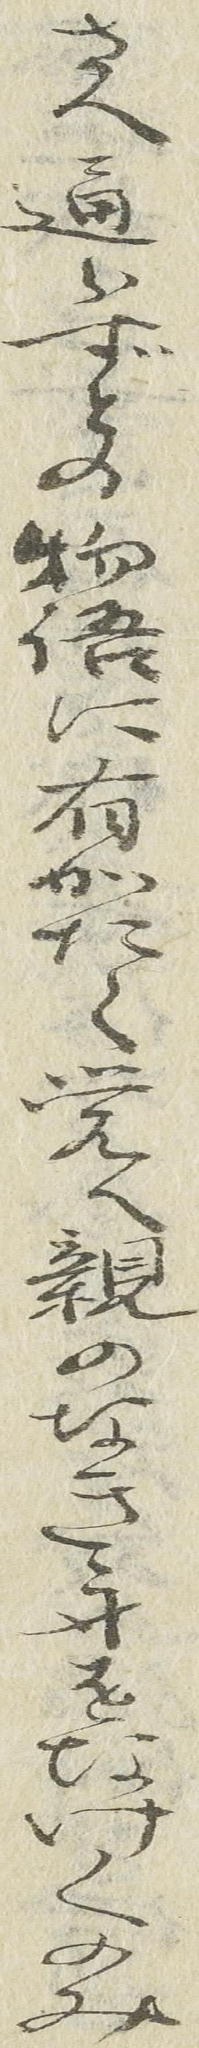さへ通らずとの物語に有かたく覚へ親のなき身をなけくのみ
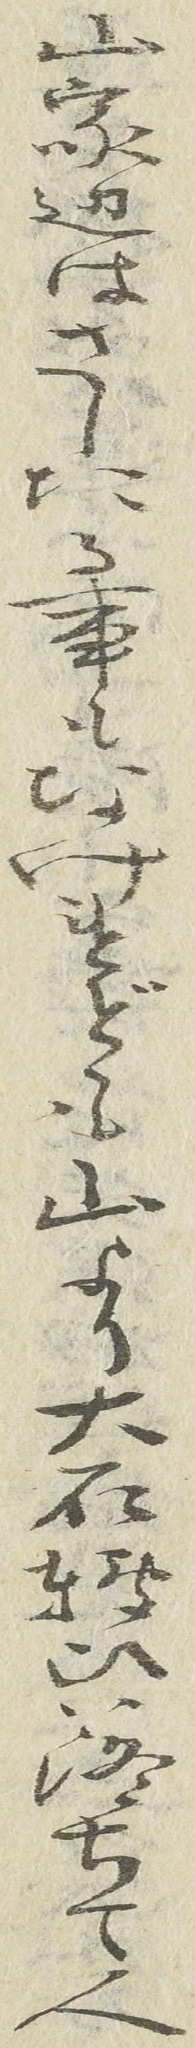山家辺はさしたる事もなけれども山より大石転ひ落ちて人
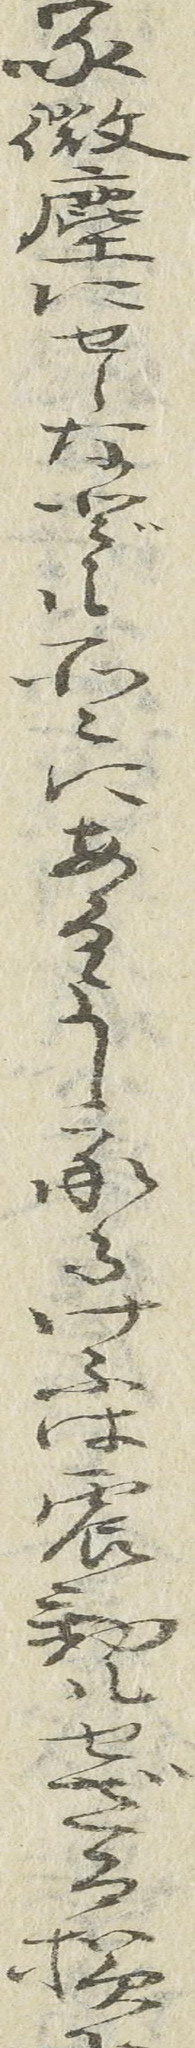家微塵にせしなども所ゝにあるよし承るけふは震動ハせざる様に
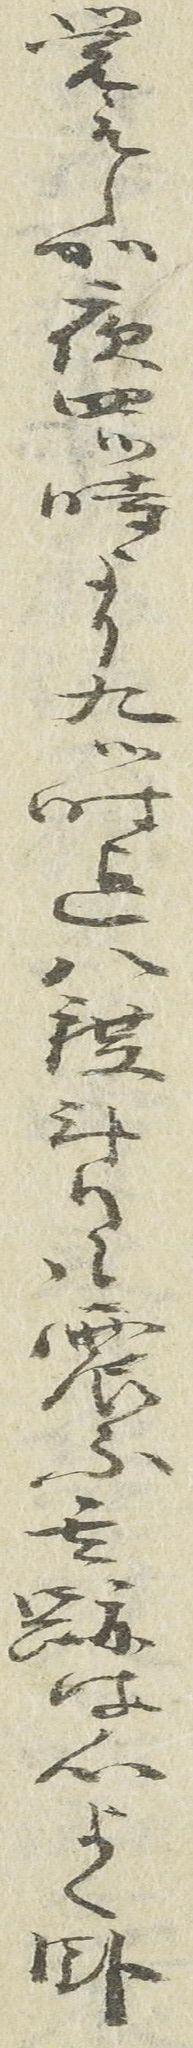覚えしか夜四ツ時より九ツ時迄八度斗りも震ふ其跡は心よく臥

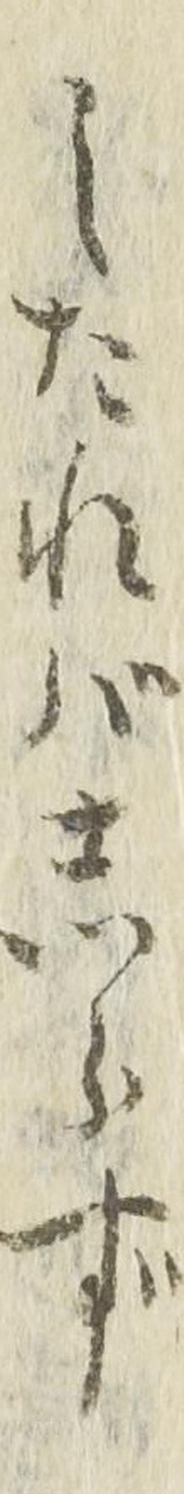したればしらず
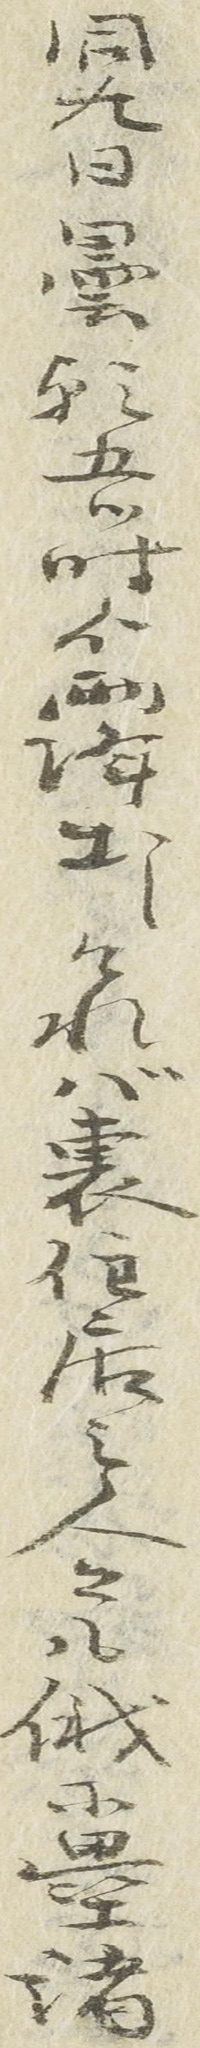同九日曇朝五ツ時ゟ雨降出しければ裏住居之人々も俄に畳諸
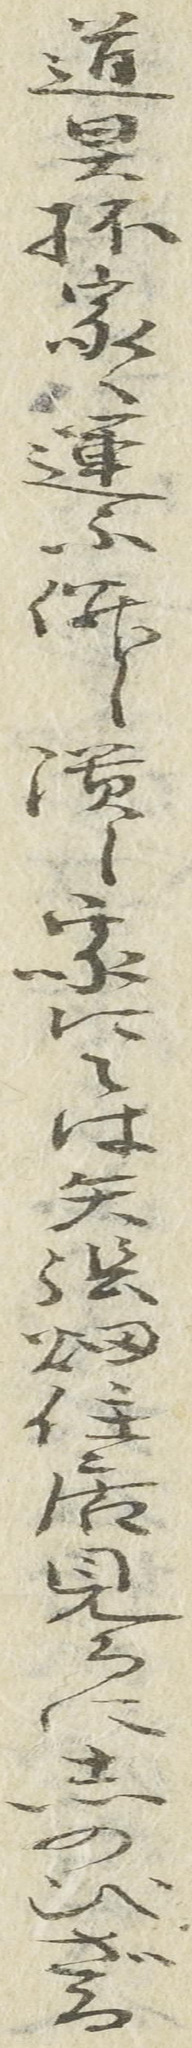道具抔家へ運ふ併し潰し家にては矢張畑住居見るにしのびざる
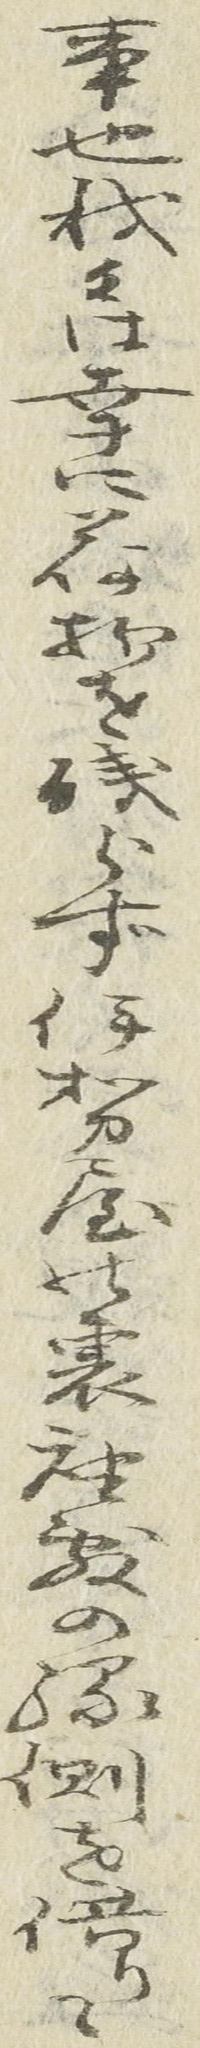事也我々は幸に荷物を残らず伊勢屋の裏座敷の縁側を借りて
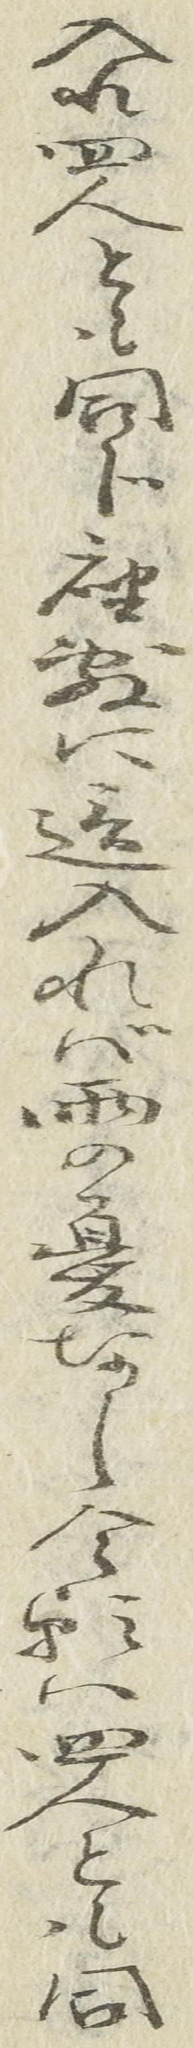入れ四人とも同じ座敷に這入れば雨の憂なし今朝は四人とも同
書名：地震前兆集　全
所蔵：東京大学地震研究所図書室 Earthquake Research Institute Library, The University of Tokyo, JAPAN
